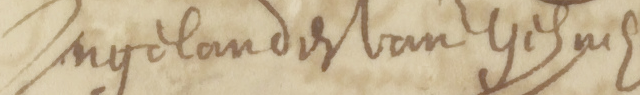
Ingelanden van gehuchte
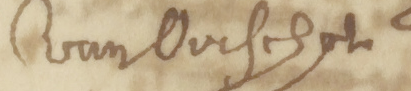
van Oirschot
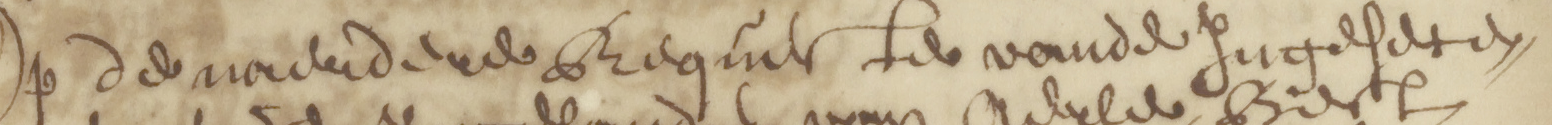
Op de naerdere Requeste vande Ingesete,,
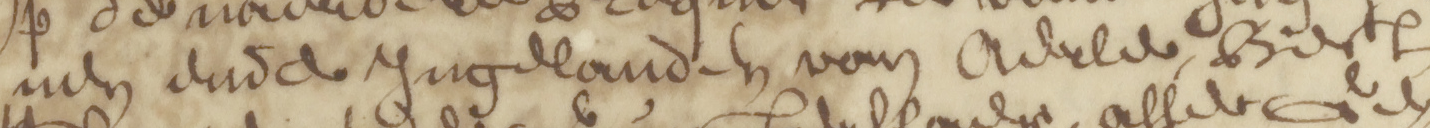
nen ende Ingelanden van Aerle, Best,
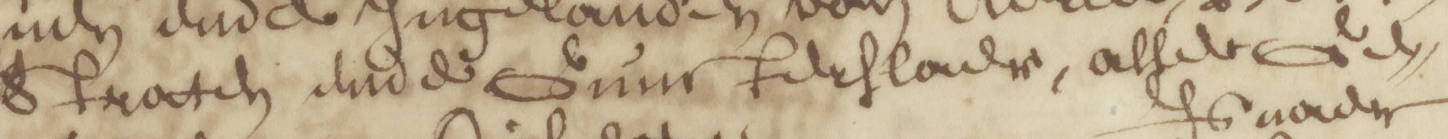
Straten ende Gunsterslaer, alle Ge,,
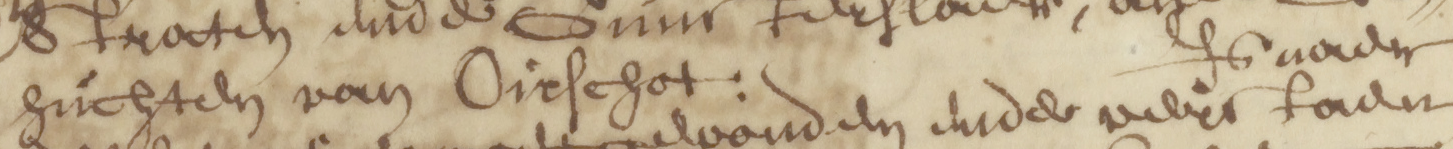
huchten van Oirschot: Is naer
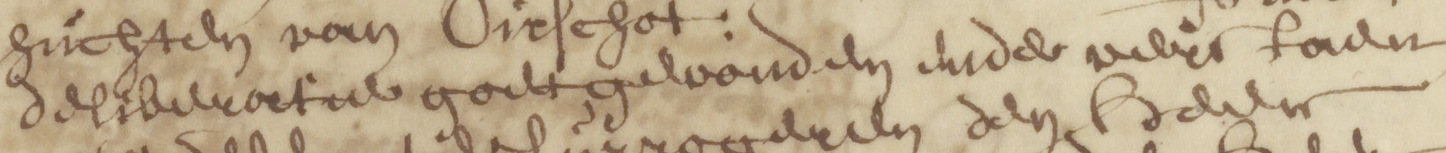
deliberatie goet gevonden ende verstaen
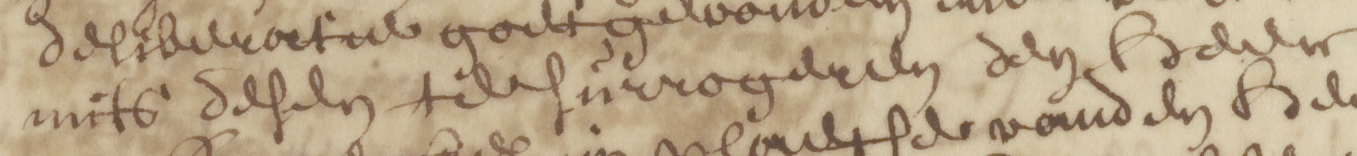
mits desen te surrogeren den Heer
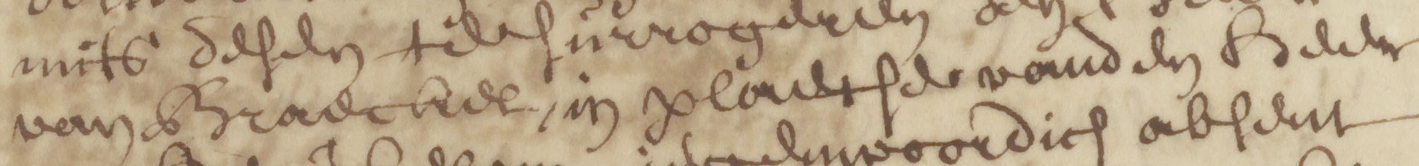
van Braeckel, in plaetse vanden Heer
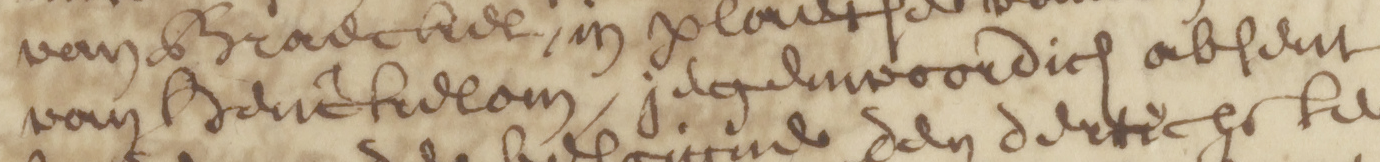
van Heuckelom, jegenwoordich absent
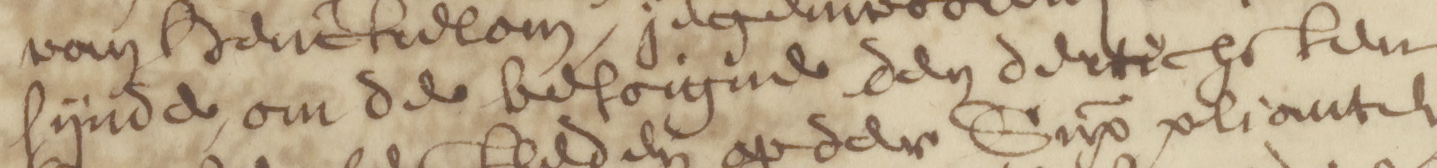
sijnde, om de besoigne den dertichsten
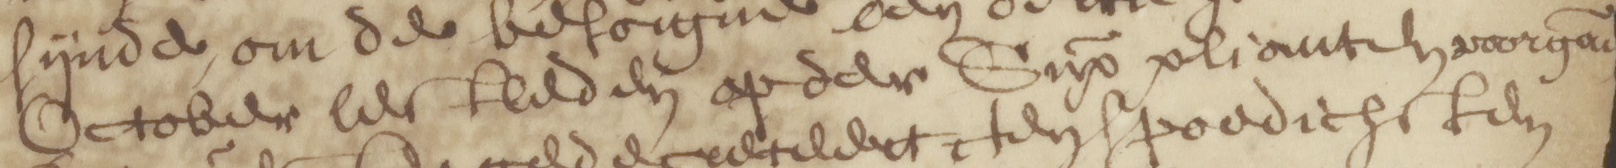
October lestleden op der Supplianten voorgae
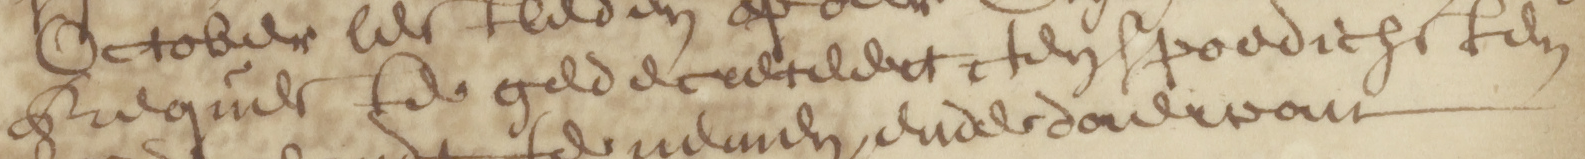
Requeste gedecreteert, ten spoedichsten
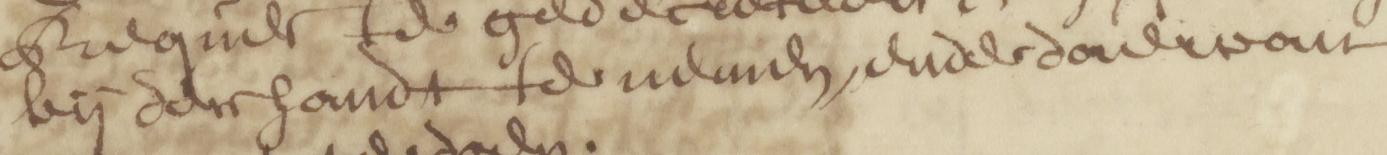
bij derhandt te nemen, ende daervan
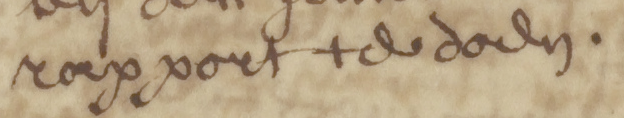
rapport te doen.
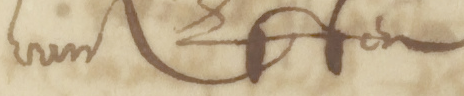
Van Effen
